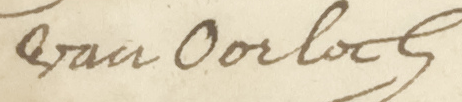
van Oorloch
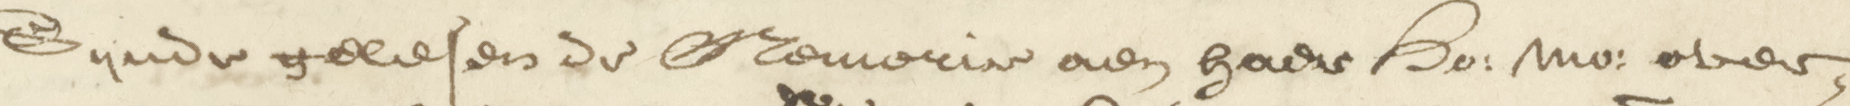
Synde gelesen de Memorie aen haer Ho:Mo: over„
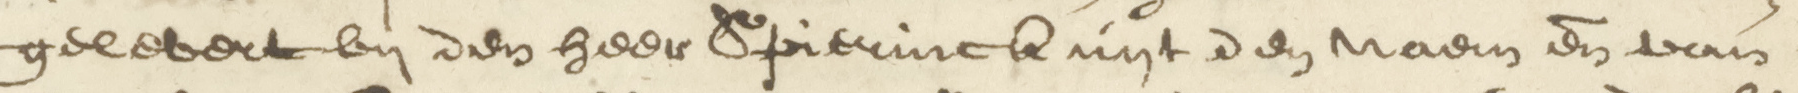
gelevert by den heer Spierinck uyt den naem en van
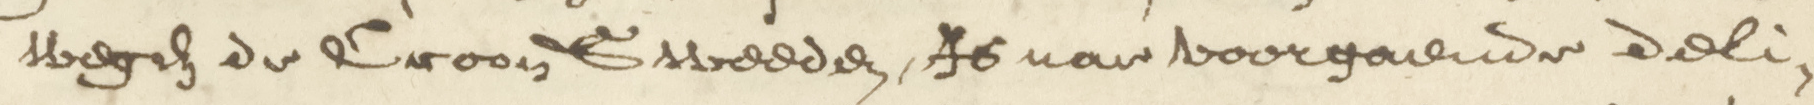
wegen de Croon Sweeden. Is nae voorgaende deli„
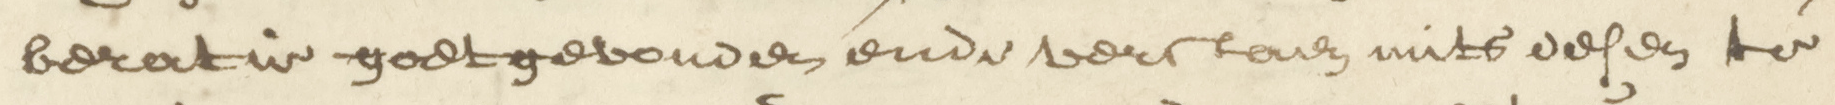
beratie goetgevonden ende verstaen mits desen te
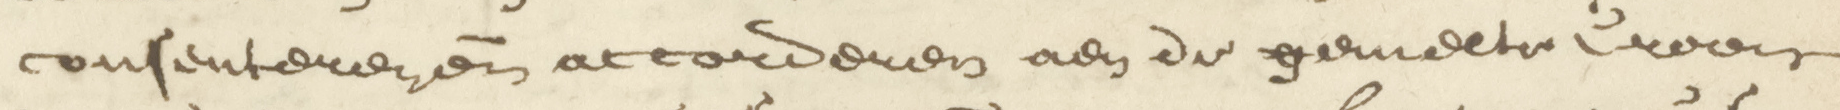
consenteren en accorderen aen de gemelte Croon
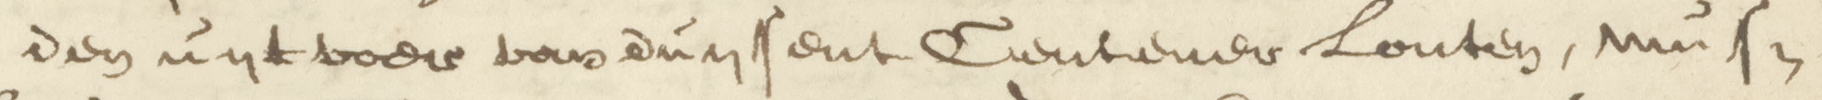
den uytvoer van duysent Centener Lonten, mus„
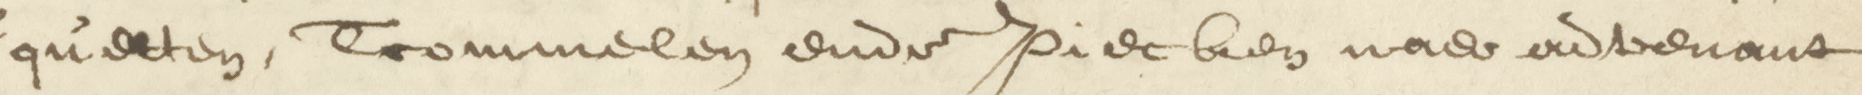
quetten, Trommelen ende Piecken nae advenant
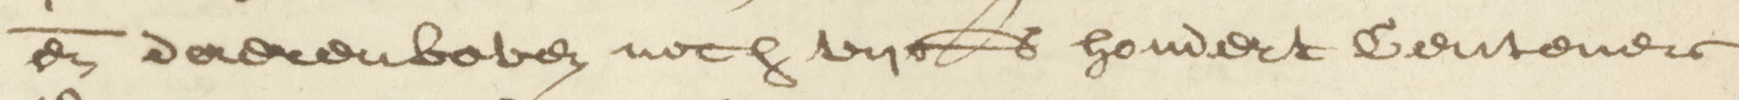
en daerenboven noch vyff hondert Centener
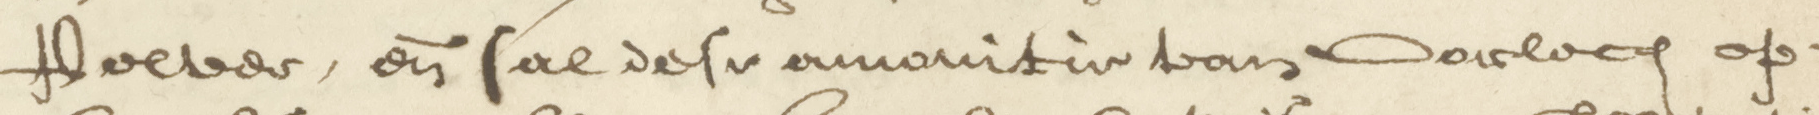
Polver, en sal dese amonitie van Oorloch op
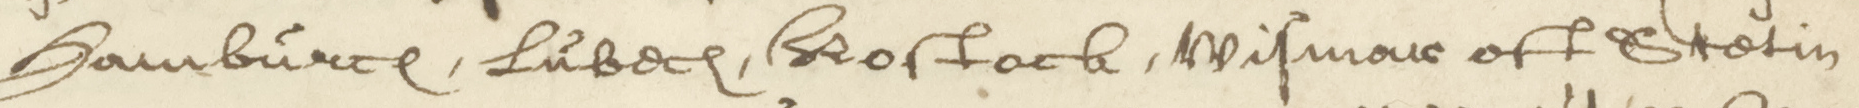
Hamburch, Lubech, Rostock, Wismar off Stetin
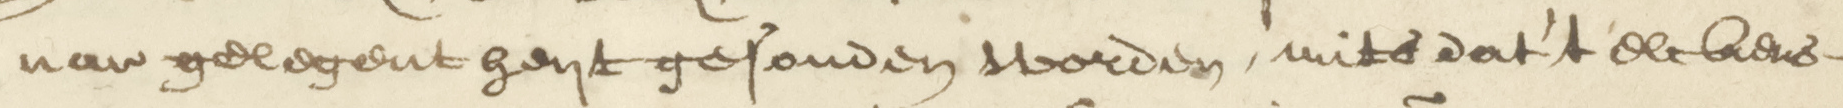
nae gelegentheyt gesonden worden, mits dat 't elckens
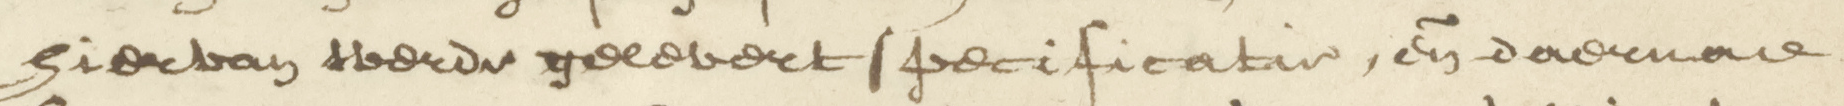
hiervan werde gelevert specificatie, en daernae
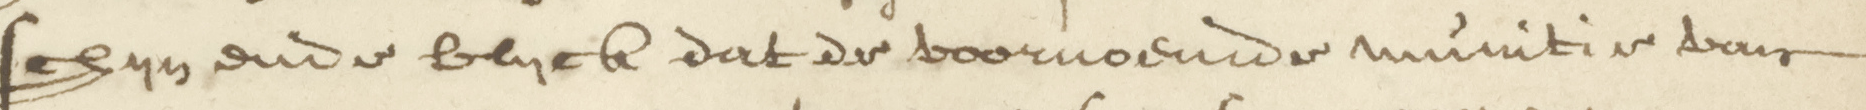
schyn ende blyck dat de voornoemde munitie van
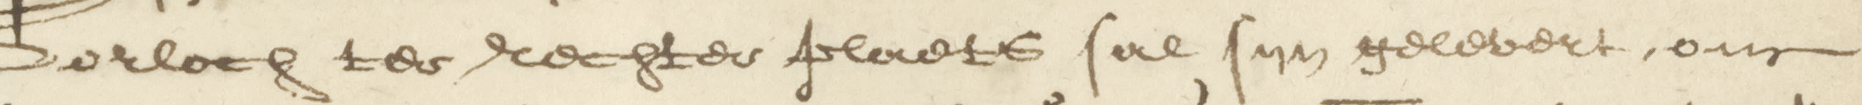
Oorloch ter rechter plaets sal syn gelevert, om
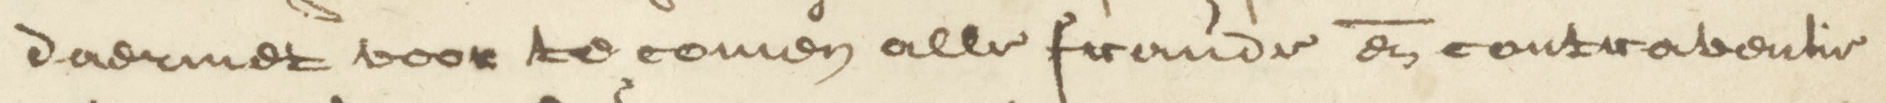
daermet voor te comen alle fraude en contraventie
